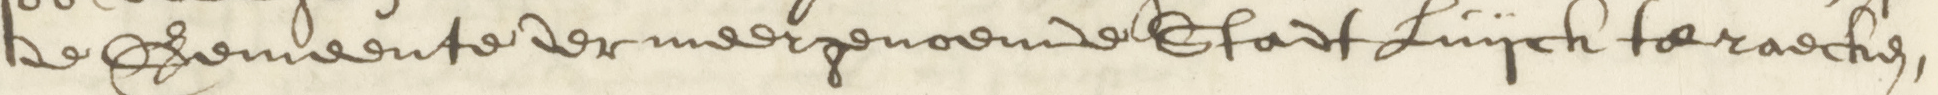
de Gemeente der meergenoemde Stadt Luijck te raecken,
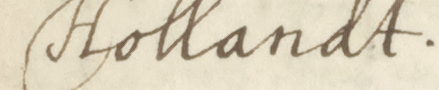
Hollandt.
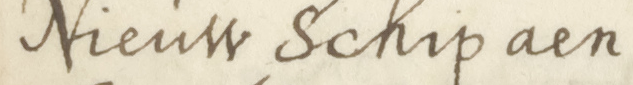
Nieuw Schip aen
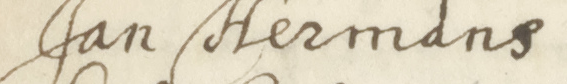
Jan Hermans
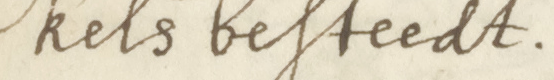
kels besteedt.
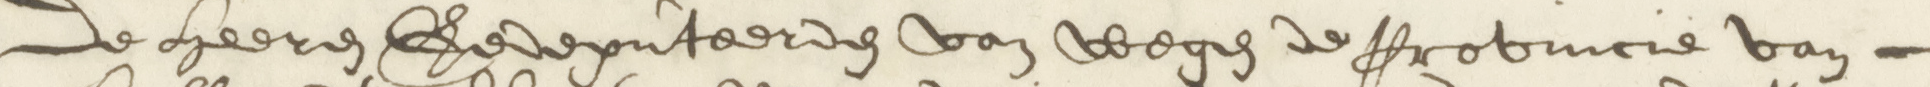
De heeren Gedeputeerden van wegen de Provincie van —
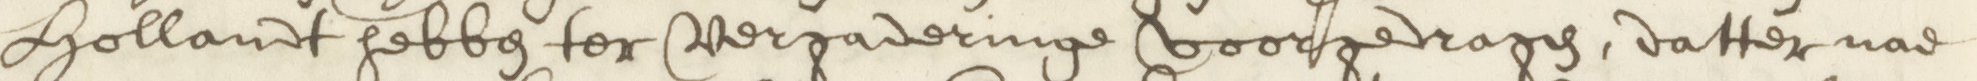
Hollandt hebben ter Vergaderinge voorgedragen, datter nae
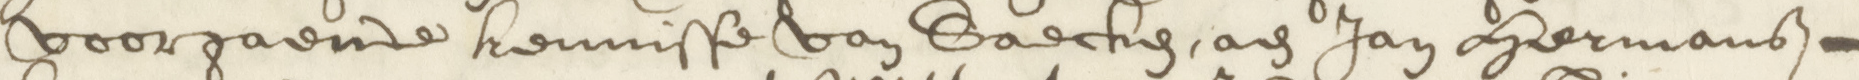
voorgaende kennisse van Saecken, aen Jan Hermansz. —
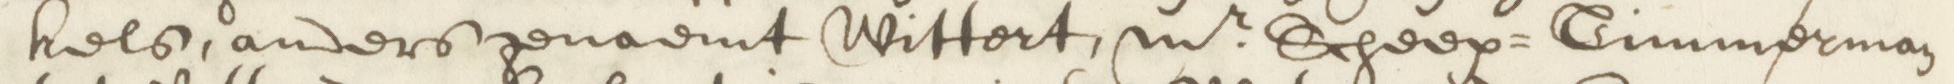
kels, anders genaemt Wittert, mr. Scheep=Timmerman
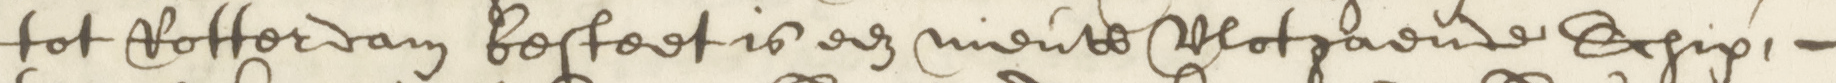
tot Rotterdam besteet is een nieuw Vlotgaende Schip, —
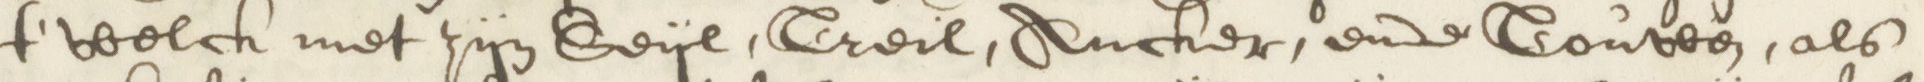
t'welck met zijn Seijl, Treil, Ancker, ende Touwen, als
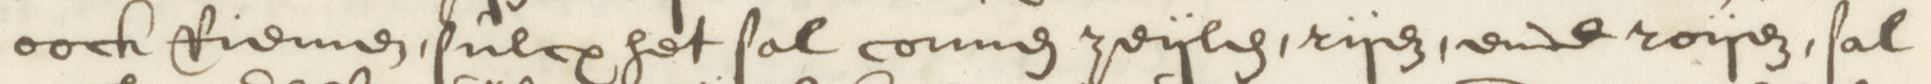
oock Riemen, sulcx het sal connen zeijlen, rijen, ende roijen, sal
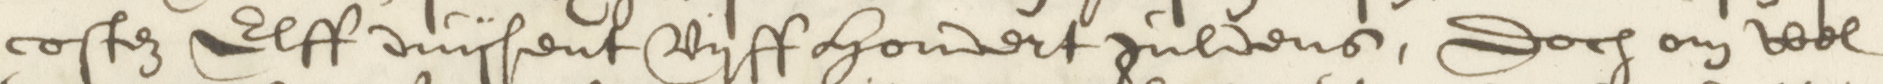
costen Elff duijsent Vijff hondert guldens, Doch om wel
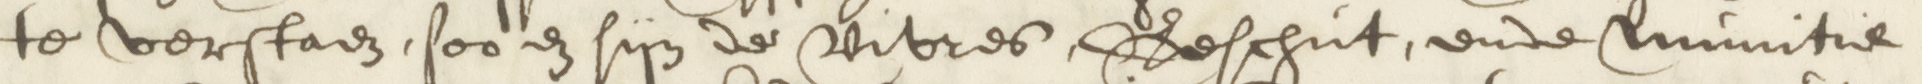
te verstaen, soo en sijn de Vivres, Geschut, ende Munitie
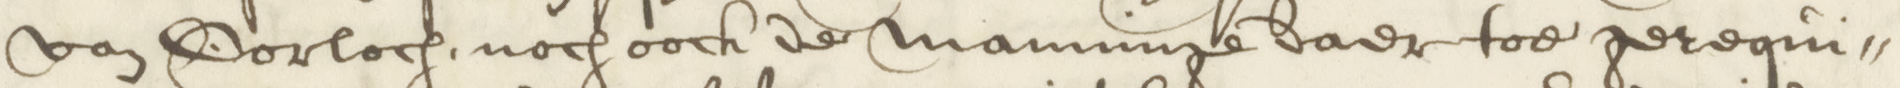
van Oorloch, noch oock de manninge daertoe gerequi„
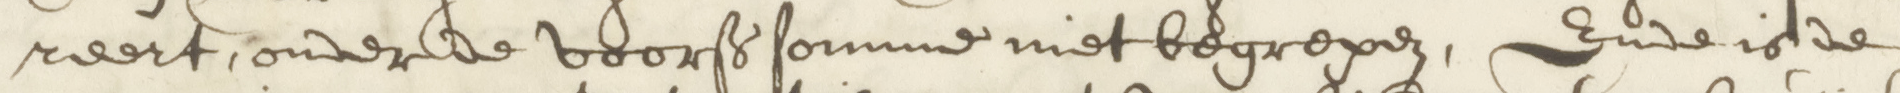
reert, onder de voors somme niet begrepen. Ende is de
